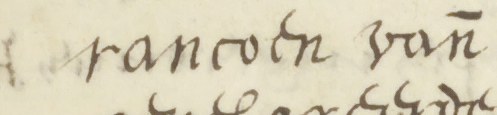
Rancoen van
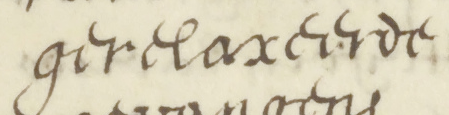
gerelaxeerde
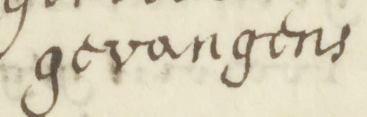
gevangens
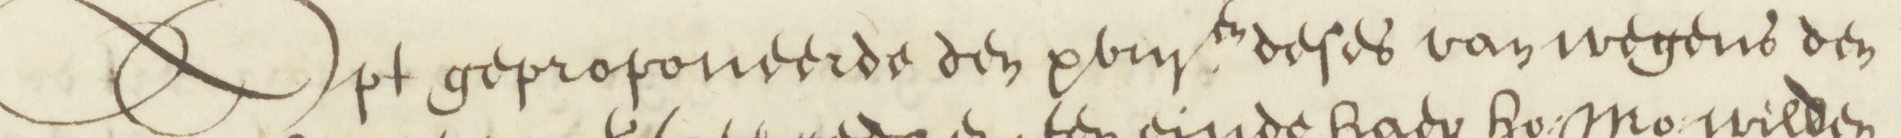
Opt geproponeerde den xviijen deses van wegens den
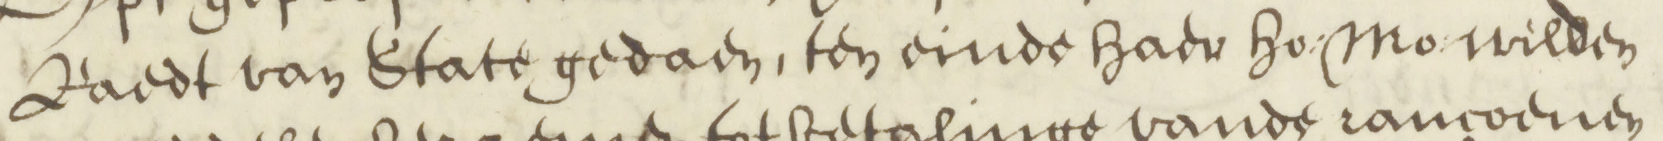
Raedt van State gedaen, ten einde haer Ho:Mo: wilden
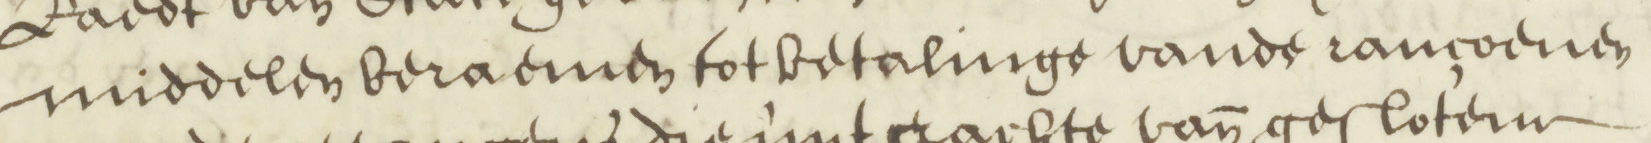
middelen beraemen tot betalinge vande rancoenen
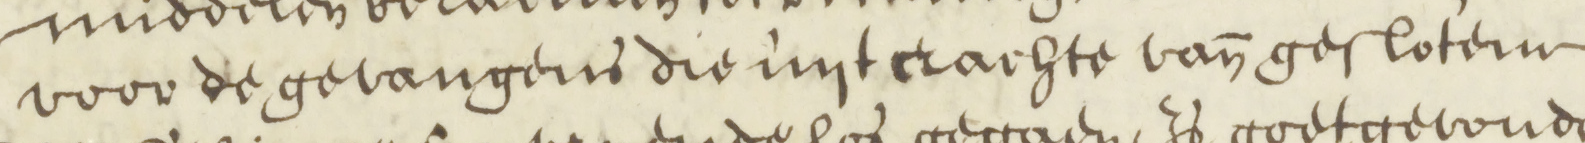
voor de gevangens die uyt crachte van geslotene
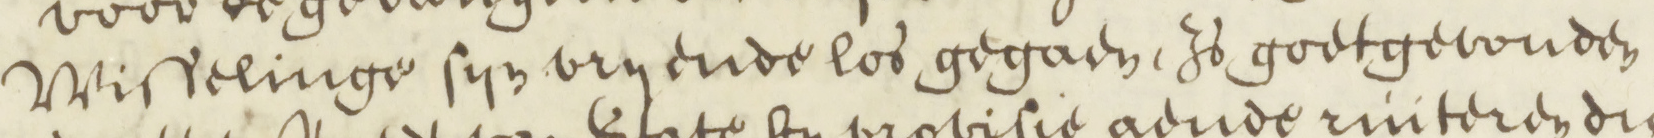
Wisselinge syn vry ende los gegaen. Is goetgevonden
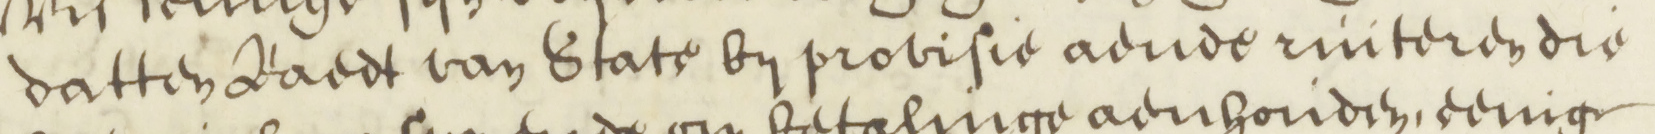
datten Raedt van State bij provisie aende ruiteren die
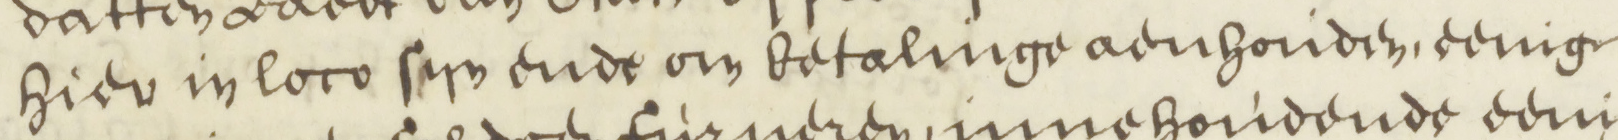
hier in loco syn ende om betalingen aenhouden, eenige
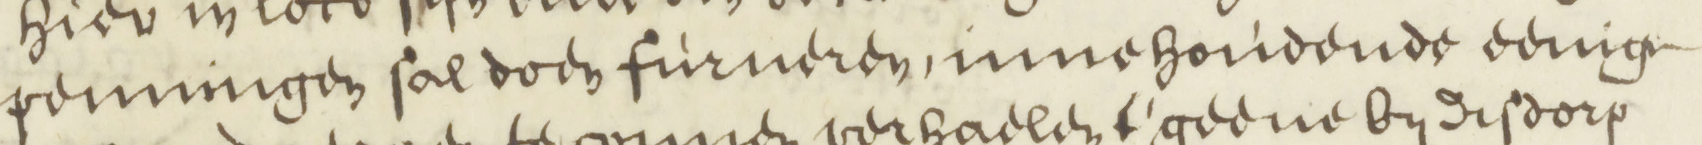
penningen sal doen furneren, innehoudende eenige
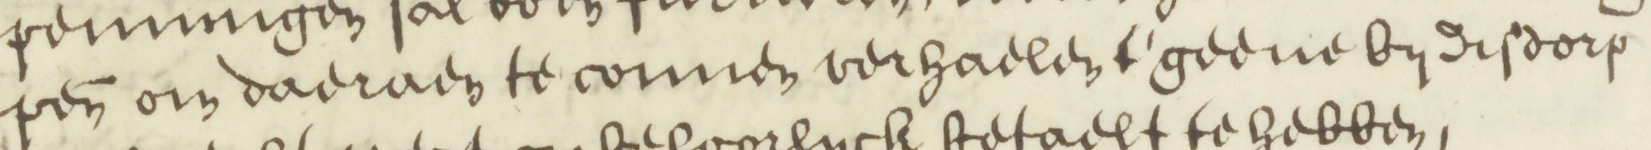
pen om daeraen te connen verhaelen t'geene bij Disdorp
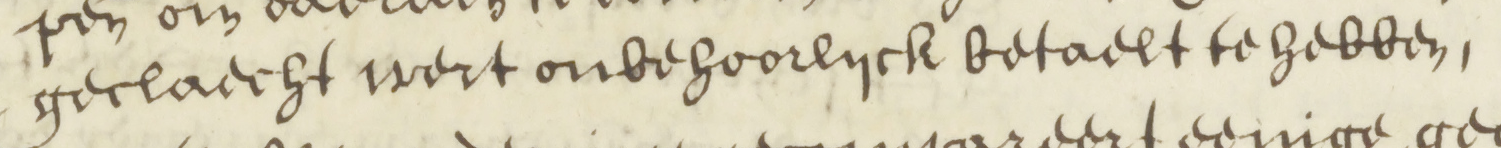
geclaecht wort onbehoorlyck betaelt te hebben.
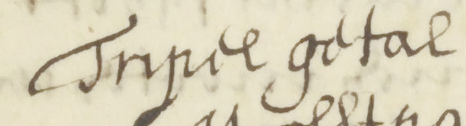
Tripel getal
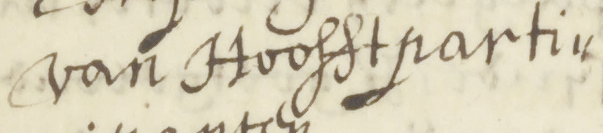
van Hoofftparti„
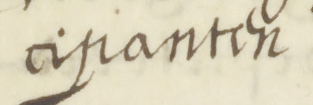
cipanten
